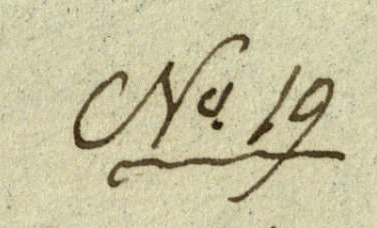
No 19.
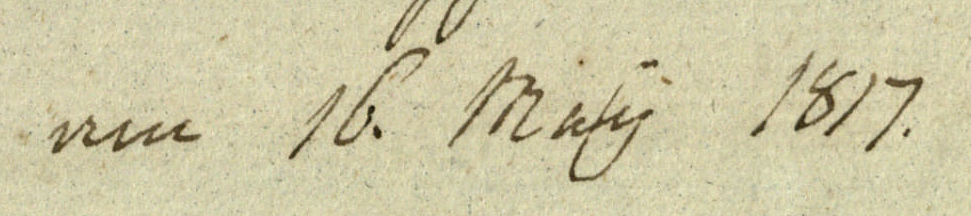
am 16. Maÿ 1807.
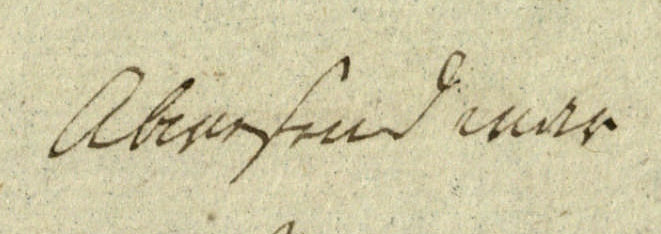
Abwesend war
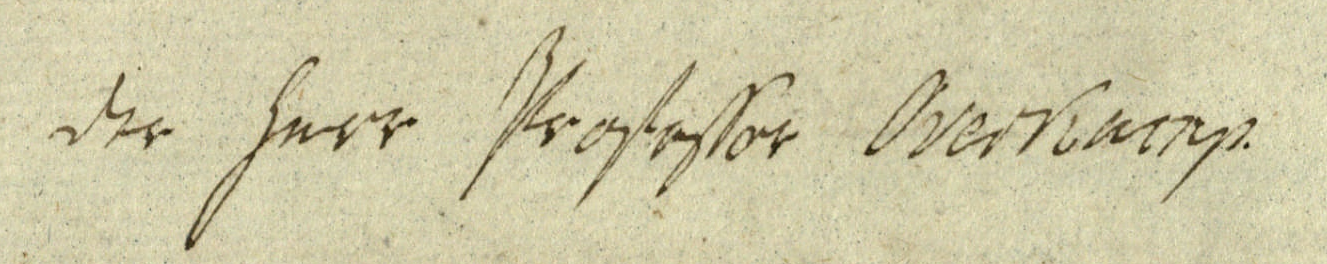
der Herr Professor Overkamp.
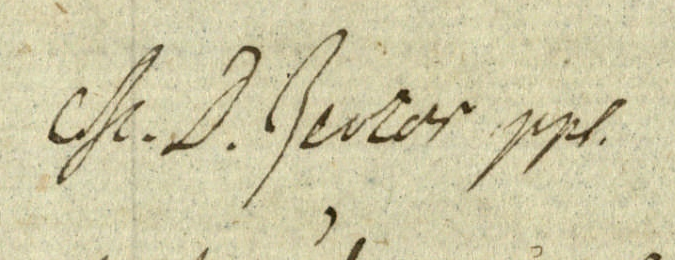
M. D. Rector ppt.
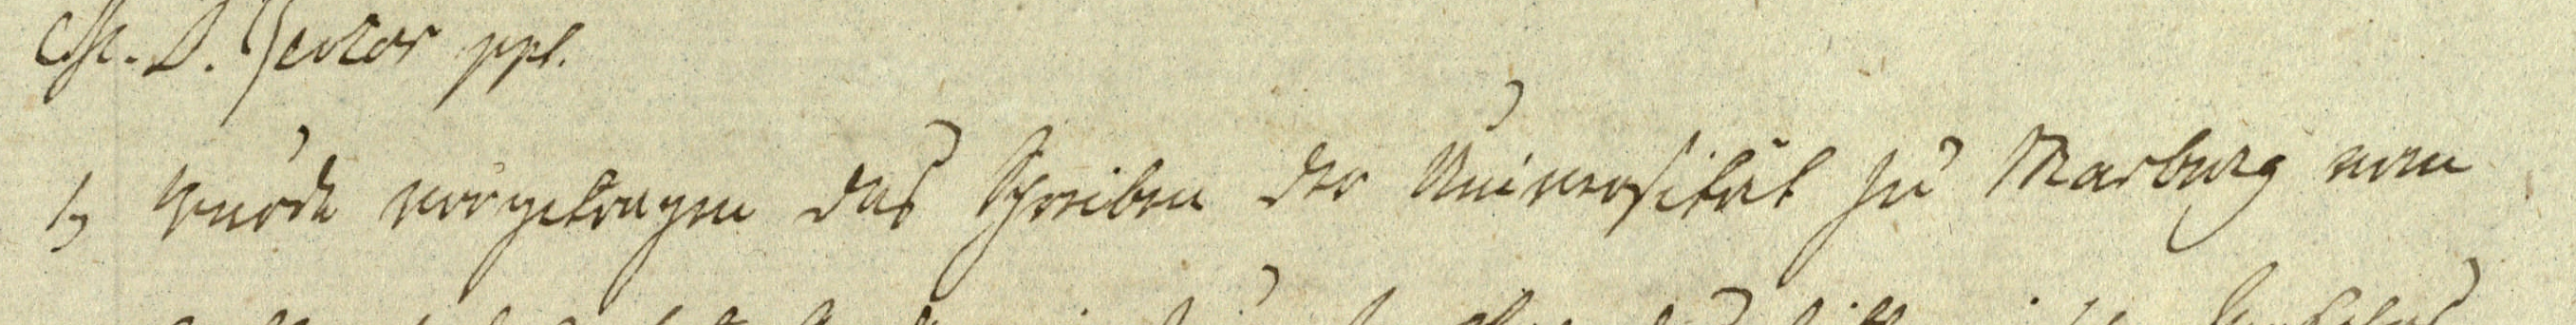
1., Wurde vorgetragen das Schreiben der Universität zu Marburg vom
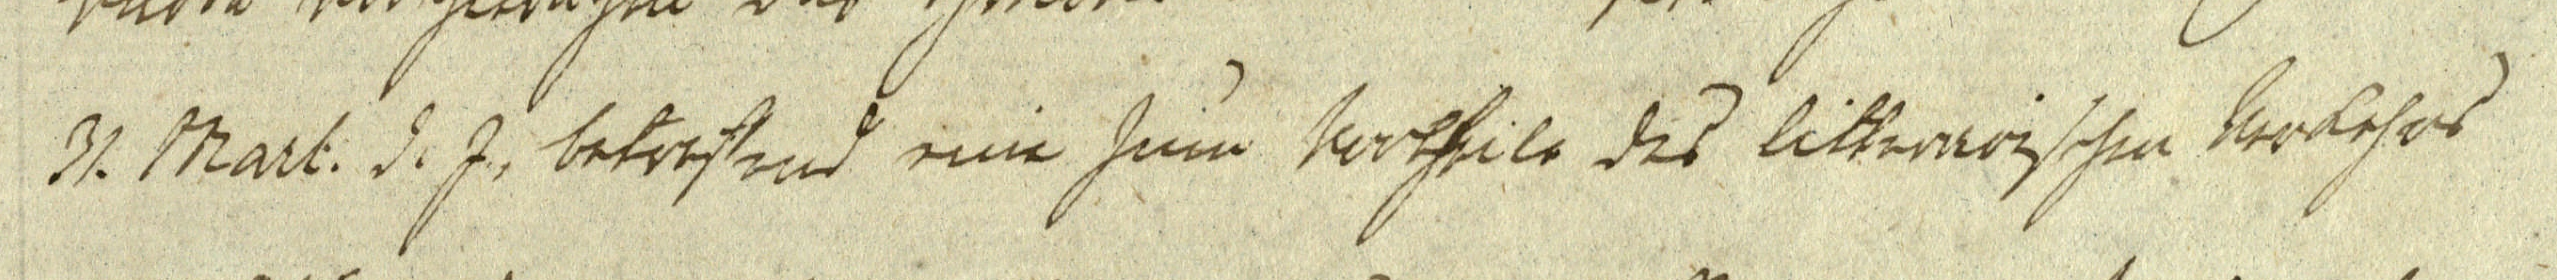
31. Mart. d. J. betreffend eine zum Vortheile des litterarischen Verkehrs
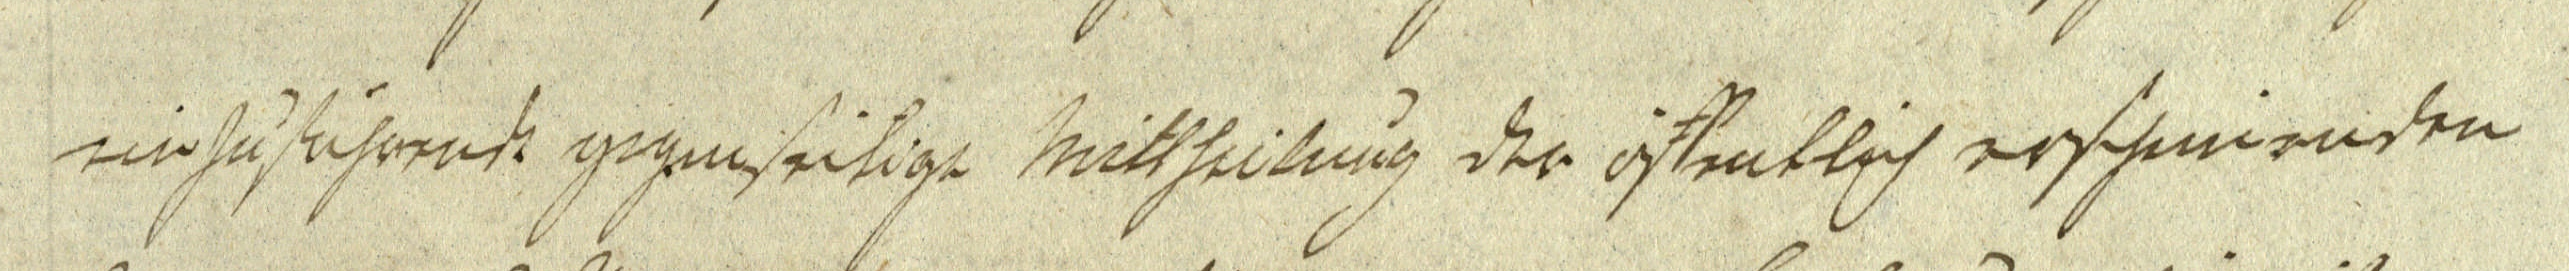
einzuführende gegenseitige Mittheilung der öffentlich erscheinenden
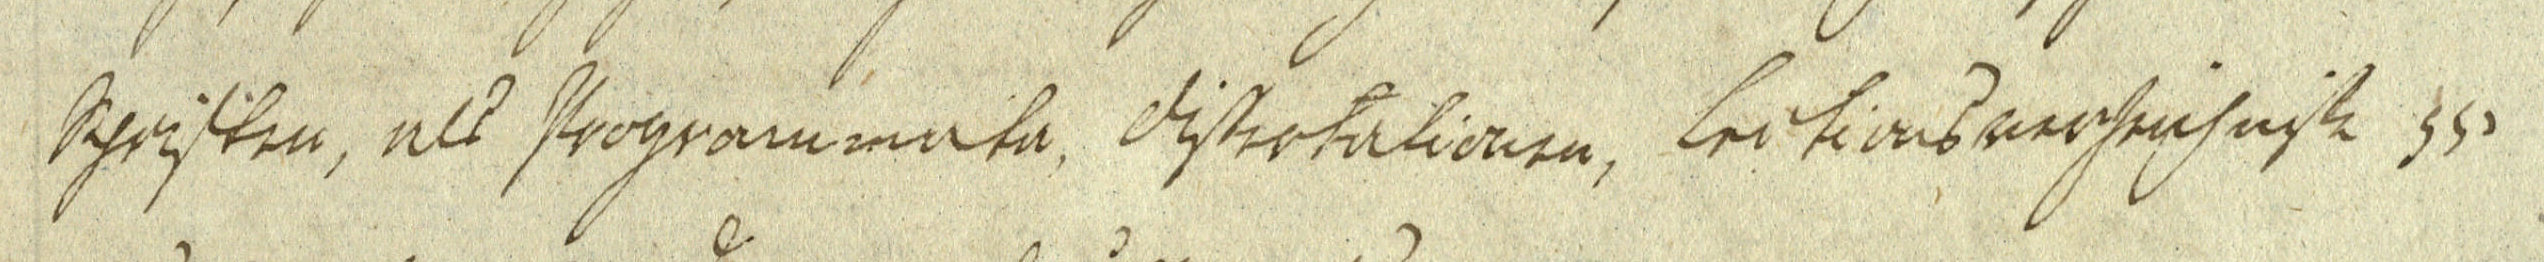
Schriften, als Programmata, Dissertationen, Lectionsverzeichnisse
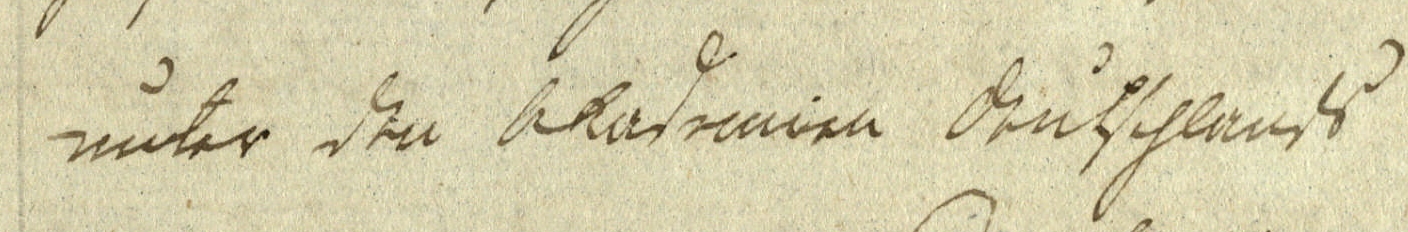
unter den Akademien Deutschlands
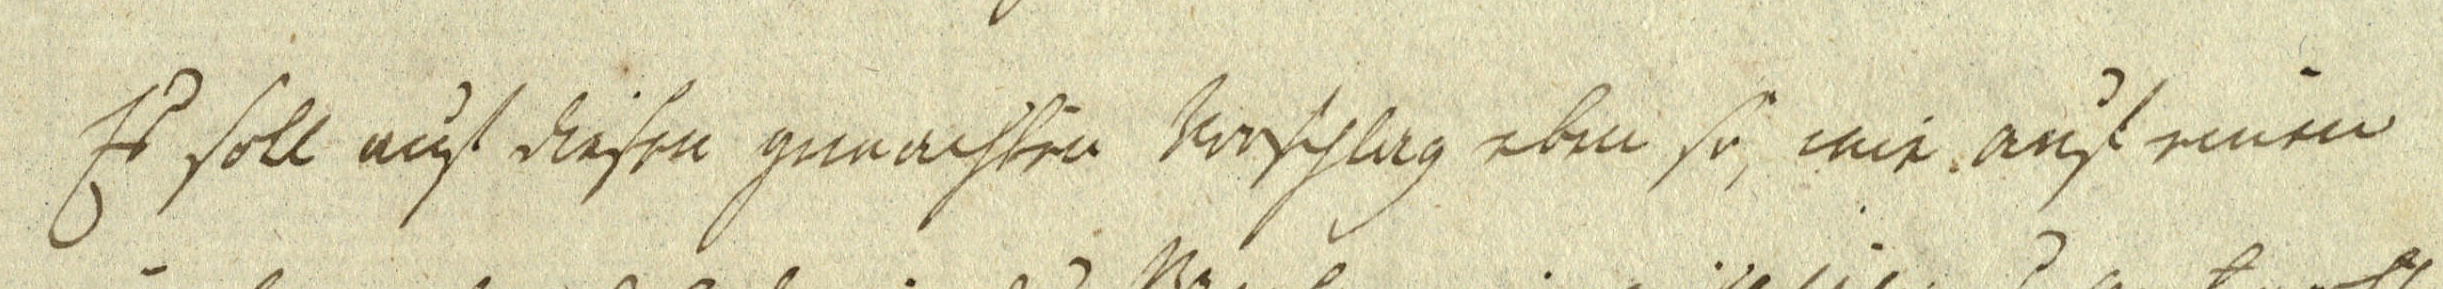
Es soll auf diesen gemachten Vorschlag eben so, wie auf einen
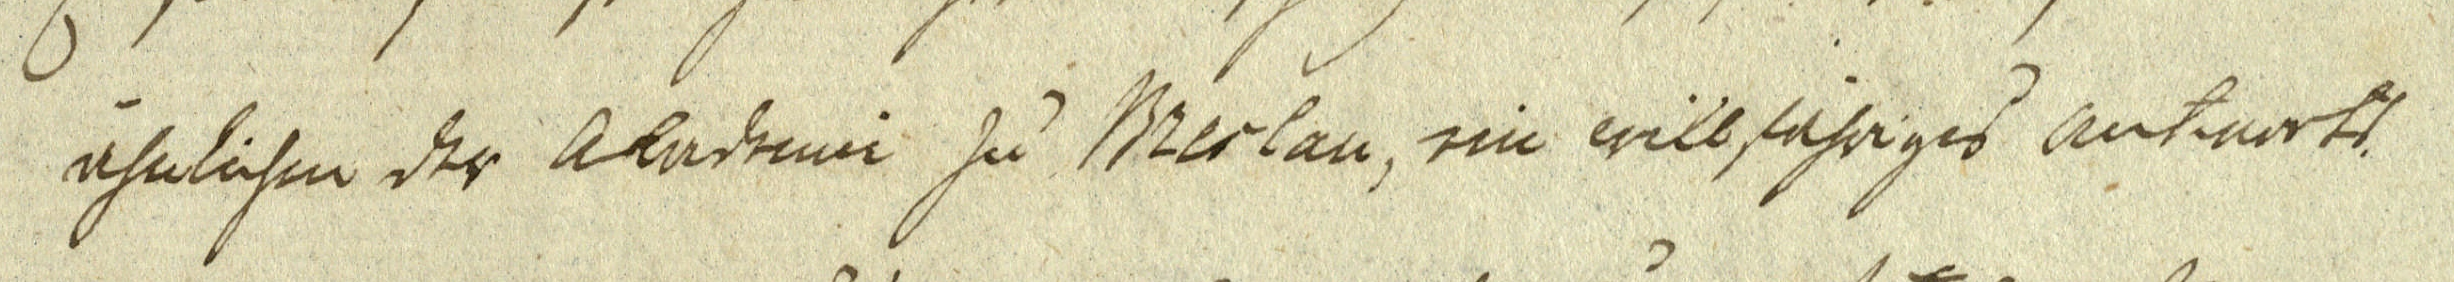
ähnlichen der Akademie zu Breslau, ein willfähriges Antworts
